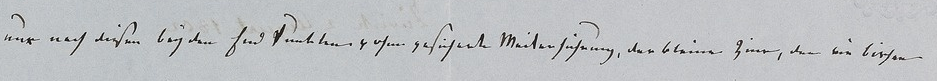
nur nach diesen beyden End Punkten & ohne gesicherte Weiterführung, der kleine Zins, den wir bisher
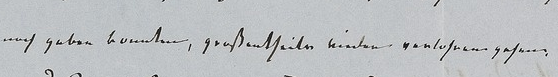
noch geben konnten, großentheils wieder verlohren gehen.
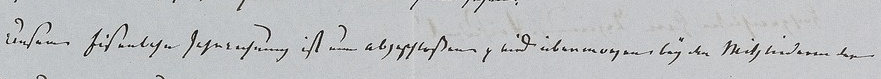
Unsere Eisenbahn Jahrrechnung ist nun abgeschloßen & wird übermorgen bey den Mitgliedern des
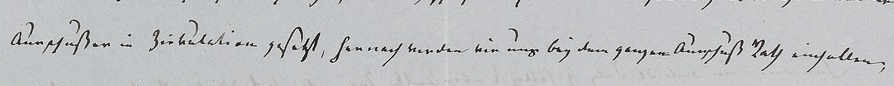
Ausschußes in Zirkulation gesetzt, hernach werden wir uns bey dem ganzen Ausschuß Rath einhollen;
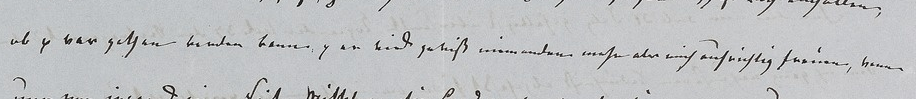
ob & was gethan werden kann & es wird gewiß niemanden mehr als mich aufrichtig freuen, wenn
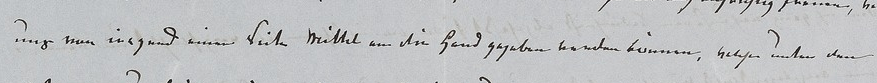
uns von irrgend einer Seite Mittel an die Hand gegeben werden können, welche unter den
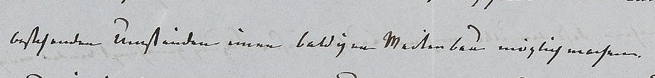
bestehenden Umständen einen baldigen Weiterbau möglich machen.
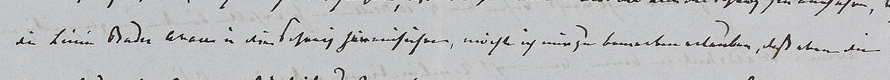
die Linie BadenArau in die Schweiz hineinführe, möchte ich mir zu bemerken erlauben, daß eben die
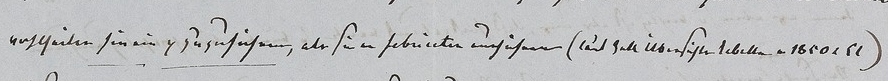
wohlfeiler hinein & zuzuführen, als sie an Fabricaten ausführen (laut Zoll Übersichtstabellen v. 1850 & 51)
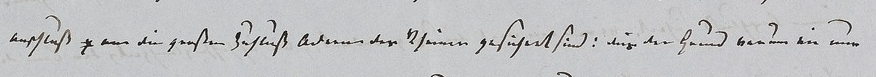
Anschluß an die großen Zufluß Adern des Rheines gesichert sind: dies der Grund warum wir nur
